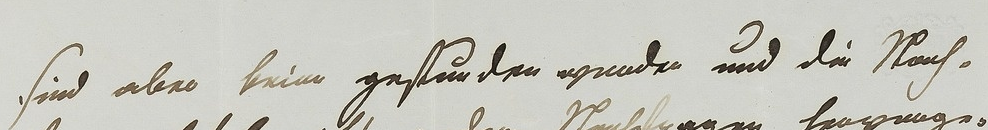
sind aber keine gefunden worden und die Nach-
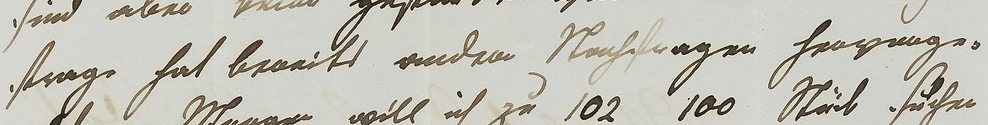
frage hat bereits andere Nachfragen hervorge-
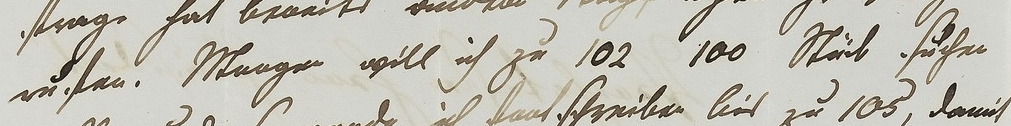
rufen. Morgen will ich zu 102 100 Stück suchen
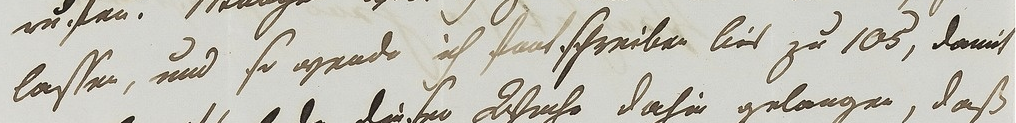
lassen, und so werde ich fortschreiben bis zu 105, damit
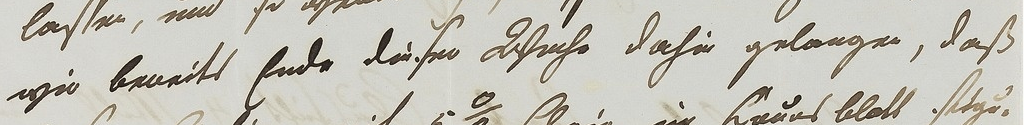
wir bereits Ende dieser Woche dahin gelangen, daß
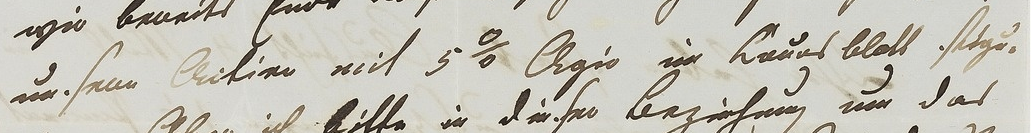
unsere Actien mit 5% Agio im Coursblatt figu-
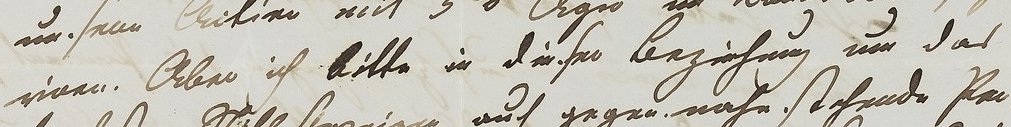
riren. Aber ich bitte in dieser Beziehung um das
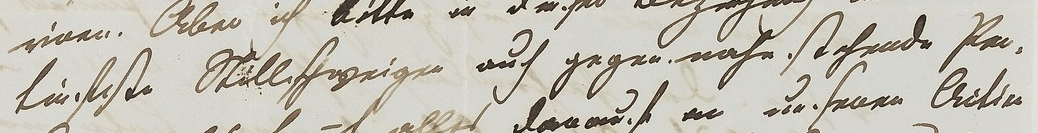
tiefste Stillschweigen auch gegen nahe stehende Per-
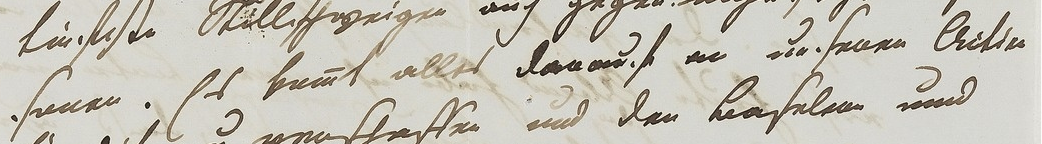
sonen. Es kommt alles darauf an unseren Actien
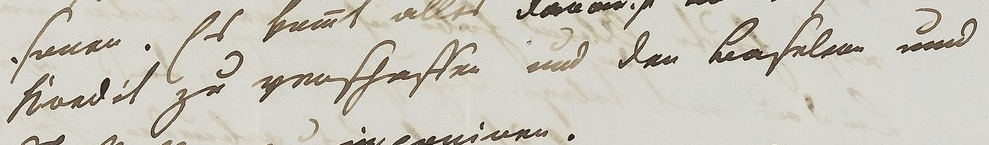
Kredit zu verschaffen und den Baselern und
